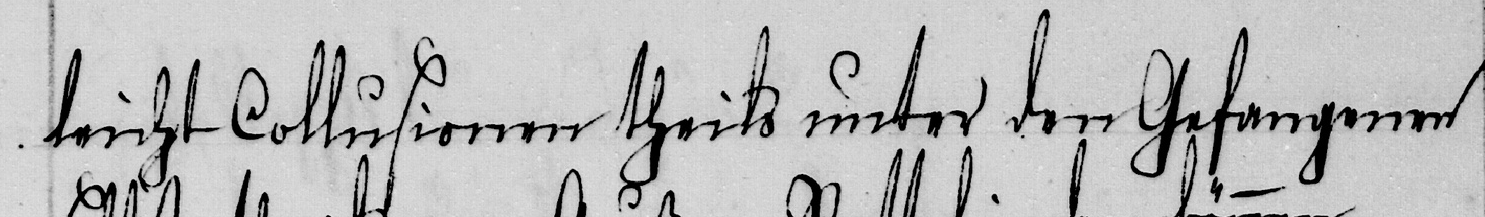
leicht Collusionen theils unter den Gefangenen
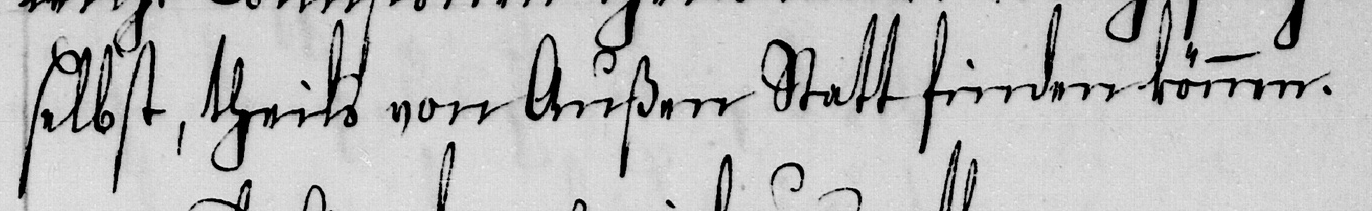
selbst, theils von Außen Statt finden können.
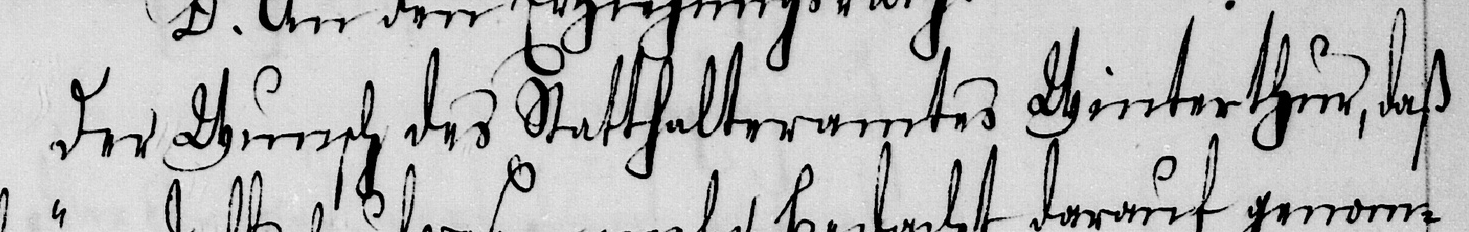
Der Wunsch des Statthalteramtes Winterthur, daß
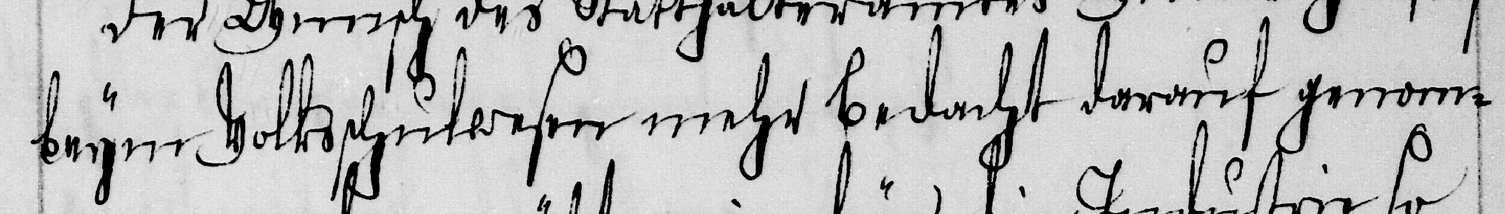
beym Volksschulwesen mehr Bedacht darauf genom¬
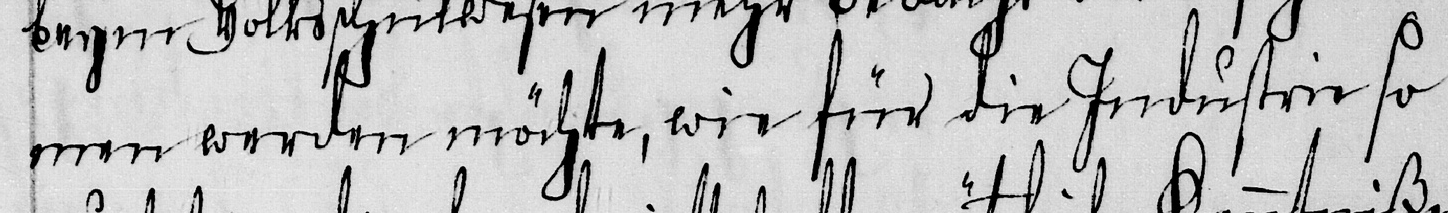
men werden möchte, wie für die Industrie so
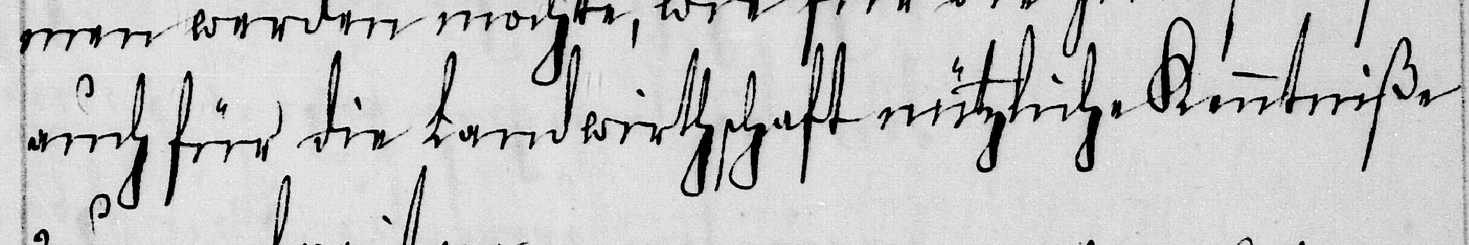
auch für Landwirthschaft nützliche Kenntniße
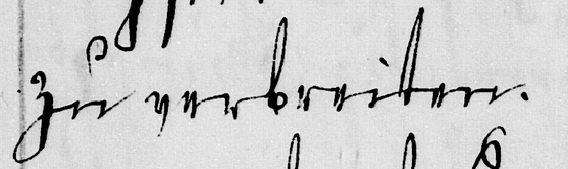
zu verbreiten.
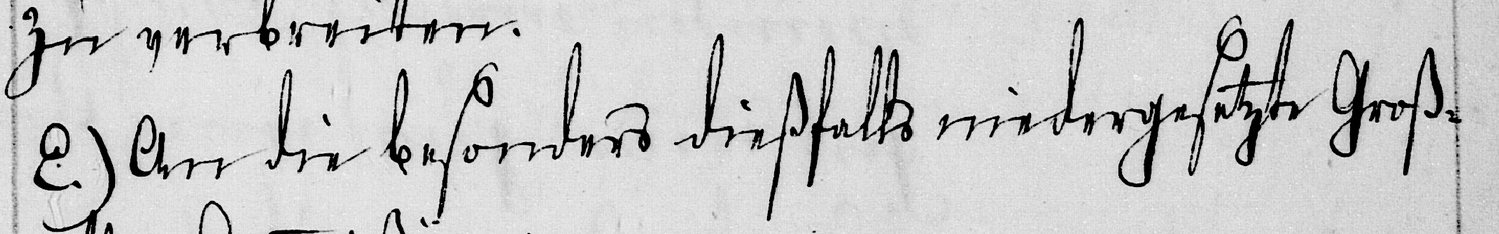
E.) An die besonders dießfalls niedergesetzte Groß¬
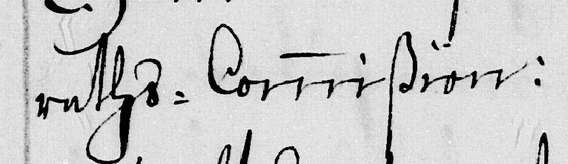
raths-Commißion:
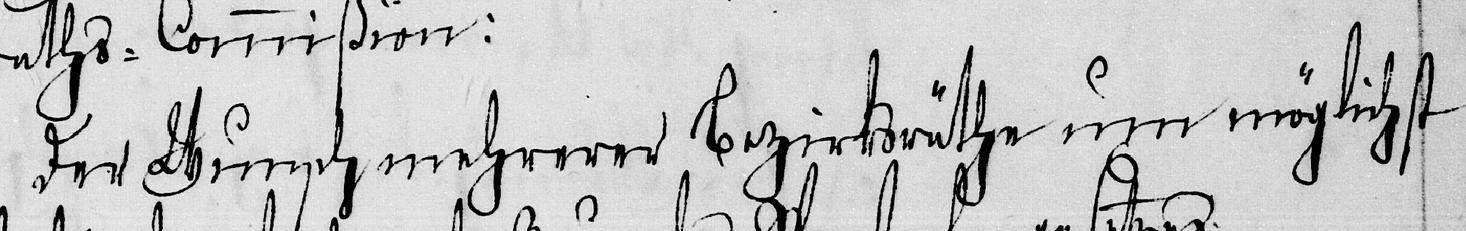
Der Wunsch mehrerer Bezirksräthe um möglichst
